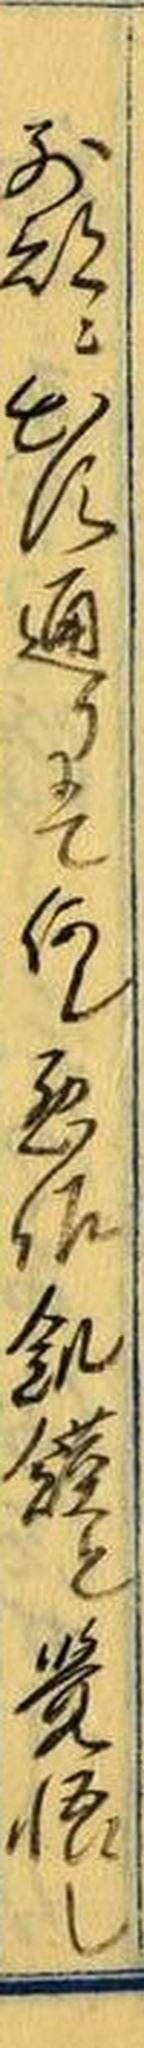別部に出す通りにて何れ悪作飢饉と覚悟し
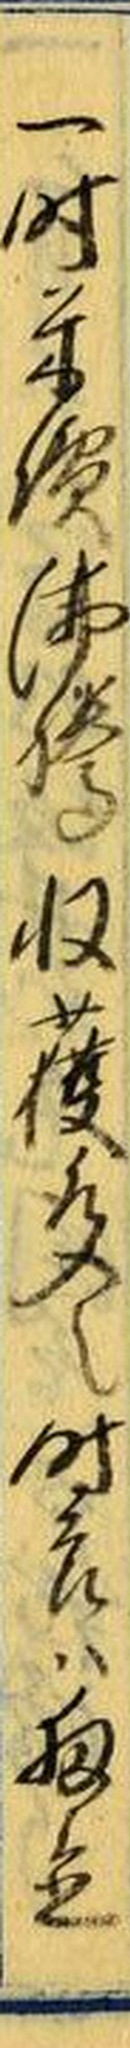一時米價沸騰収穫取入時節は拝置
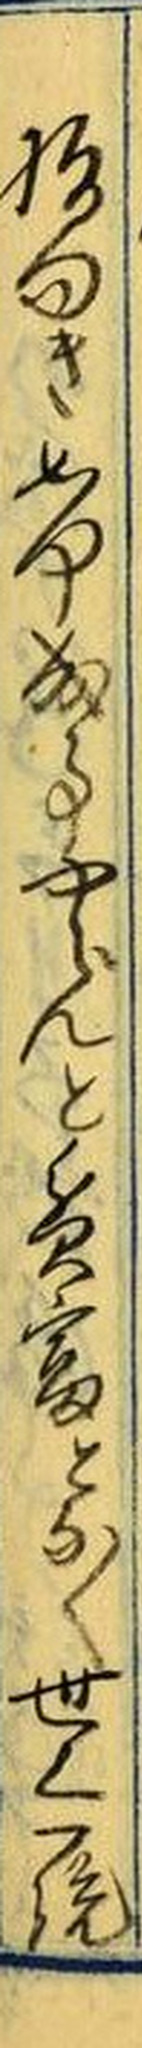指向き如何成事やらんと貧冨となく世上一統
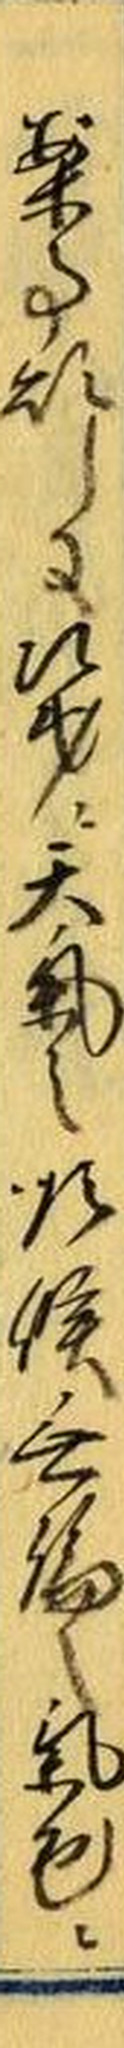案事乱しに次第に天気之順候無論之気色に
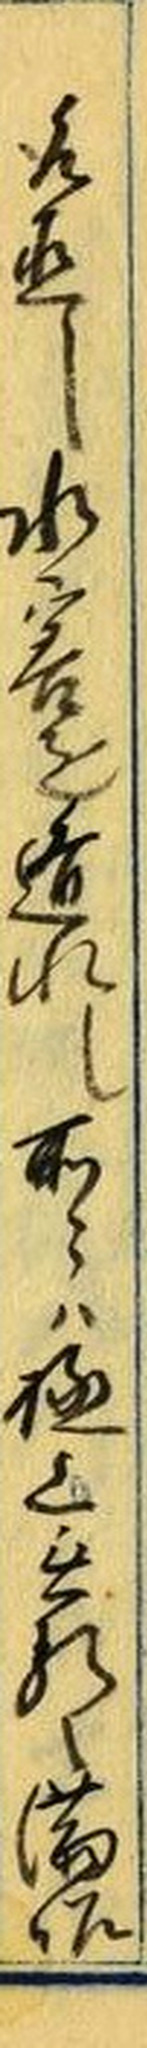取直し水害を遁れし所々は極上無類之満作
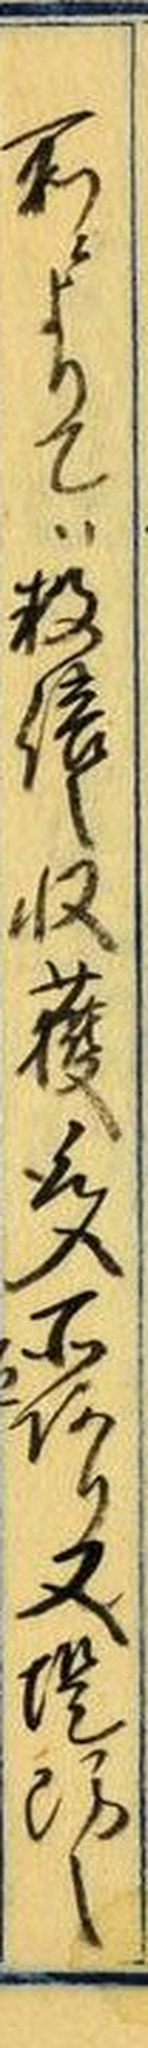所によりては数倍之収獲取入所あり又堤防之
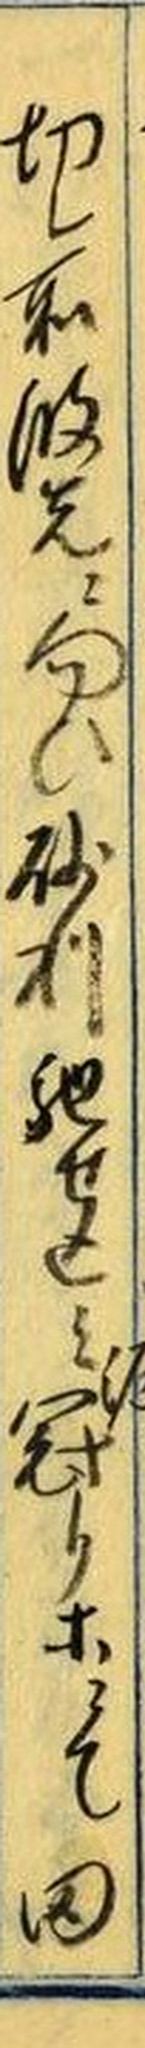切れ所彼先に向ひ砂利馳せ込み泥冠り等にて田
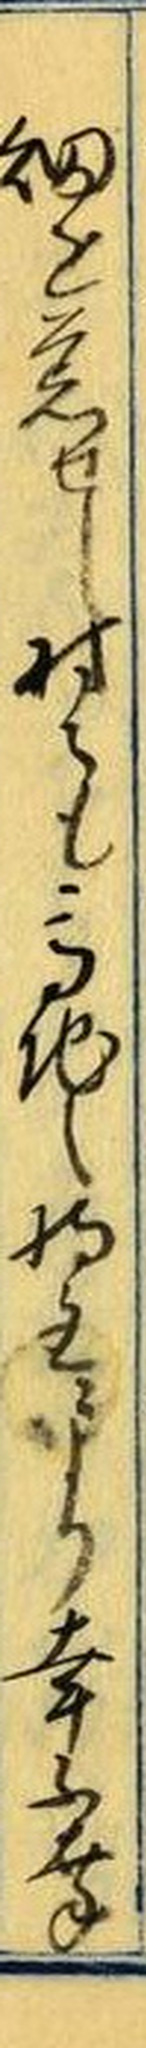畑を荒せし村々も高地之持主により幸不幸
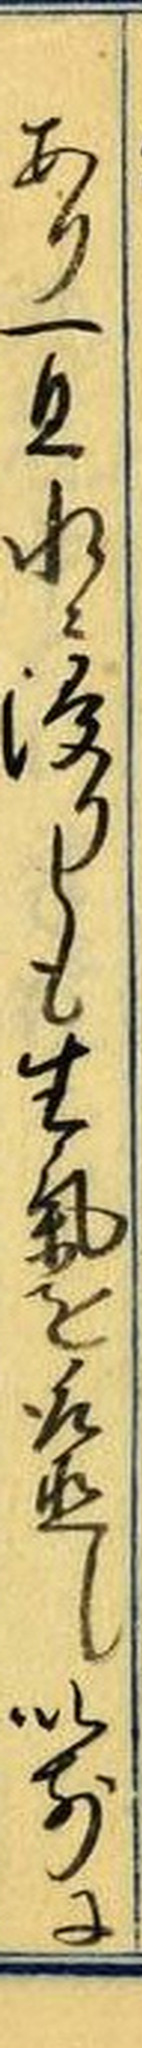あり一旦水に浸りしも生気を取直し以前に
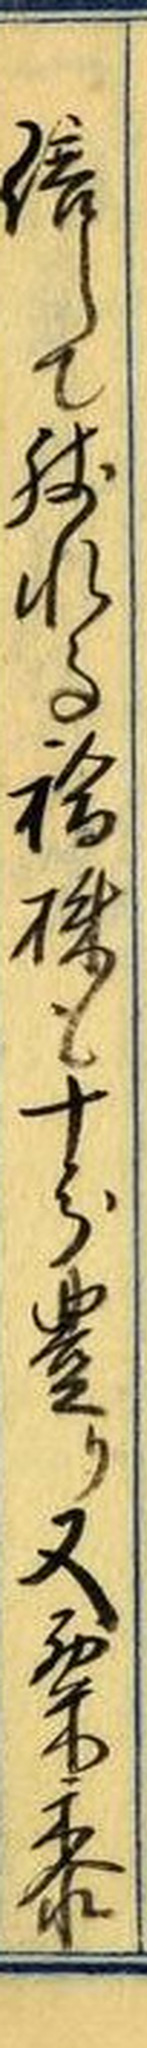倍して残れる稲株も十分豊り又粟桼
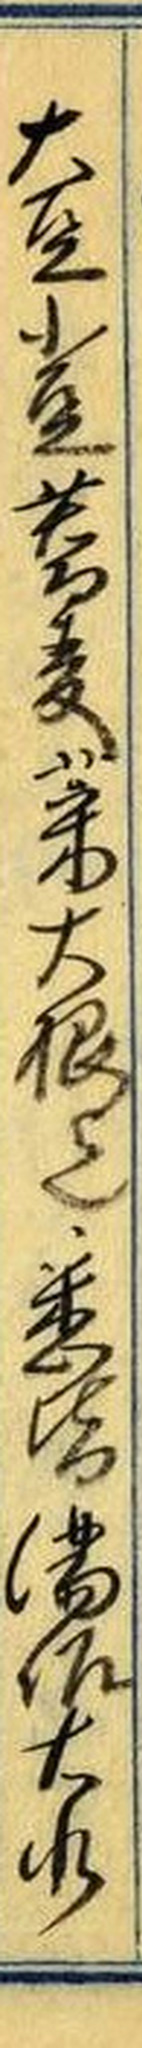大豆小豆蕎麦菜大根迄悉皆備作右水
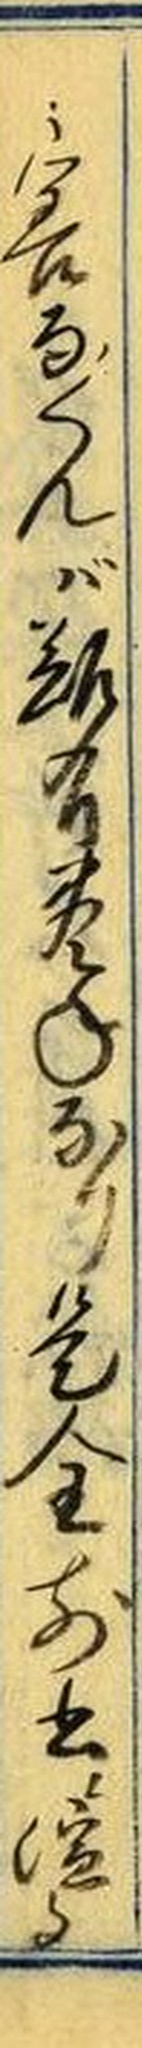害なくんば難有尽年なり是全前書に演る
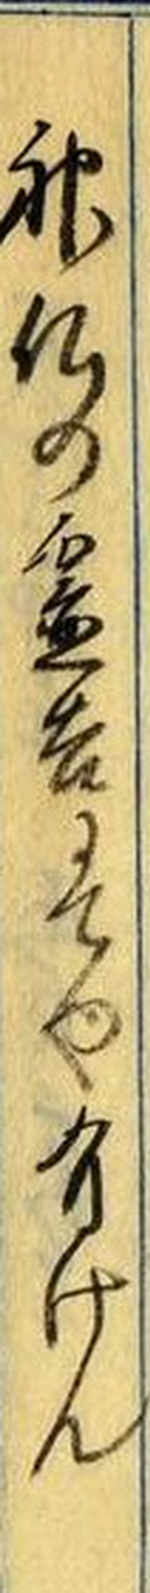神仏の霊告にてや有けん

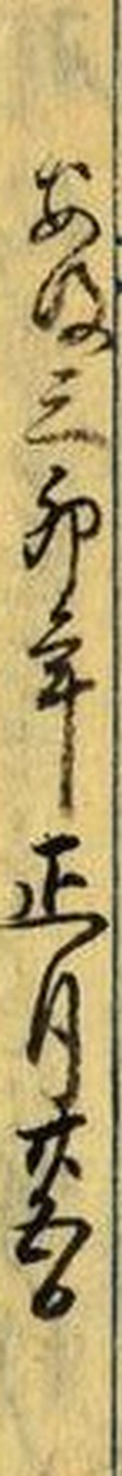安政三卯年正月廿五日
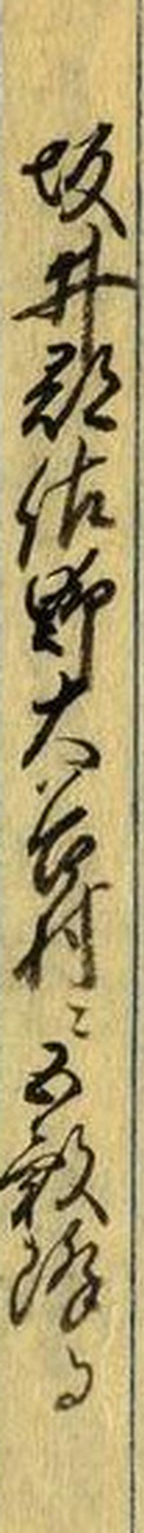坂井郡佐野大谷村に五穀降る
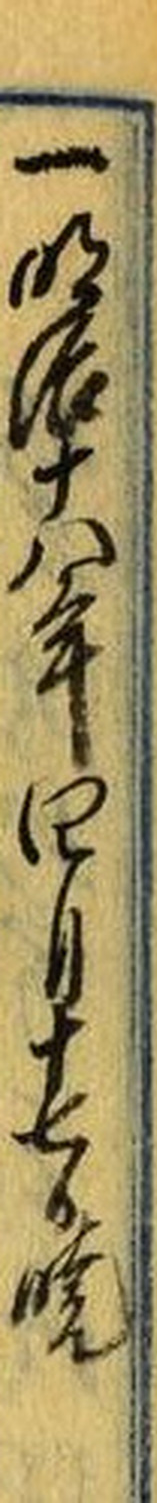一明治十八年四月十七日暁
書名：温古集 五巻
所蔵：福井県文書館 Fukui Prefectural Archives
